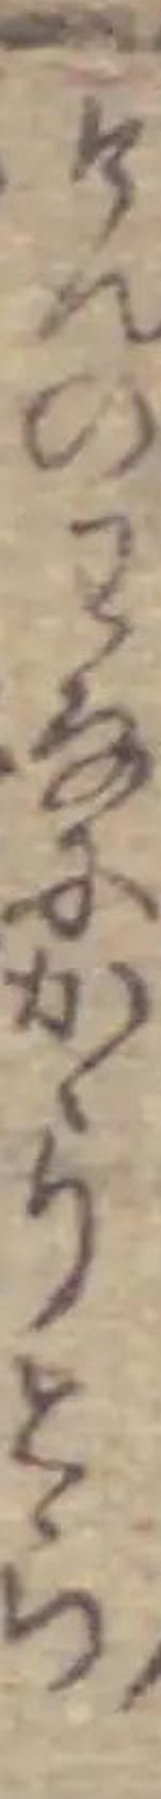けんのわなにかゝりとら
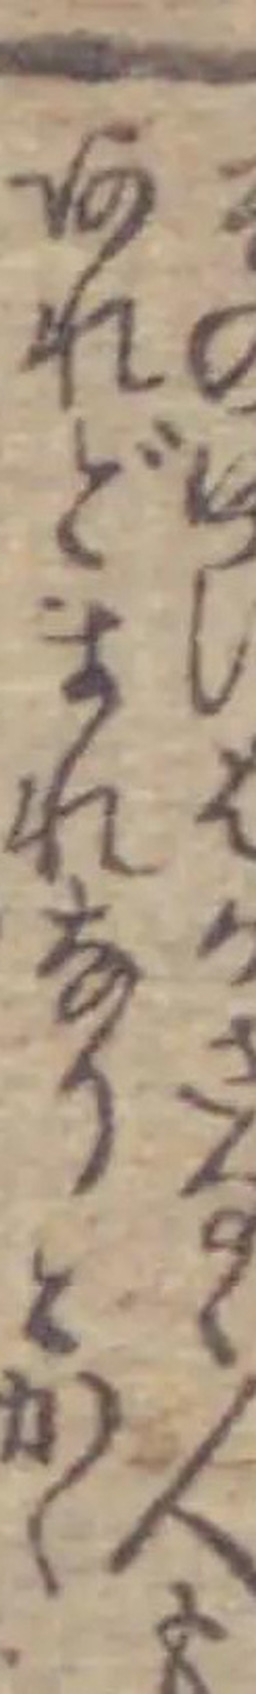あれどまれなりとかく
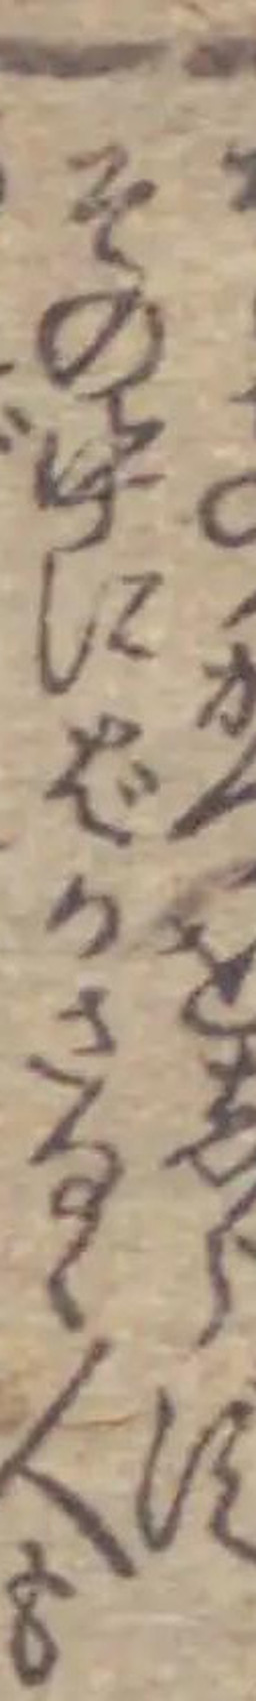その中にばかさるゝ人も
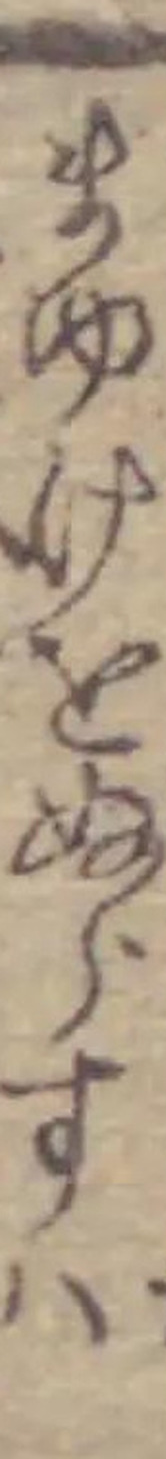まゆけをぬらすは
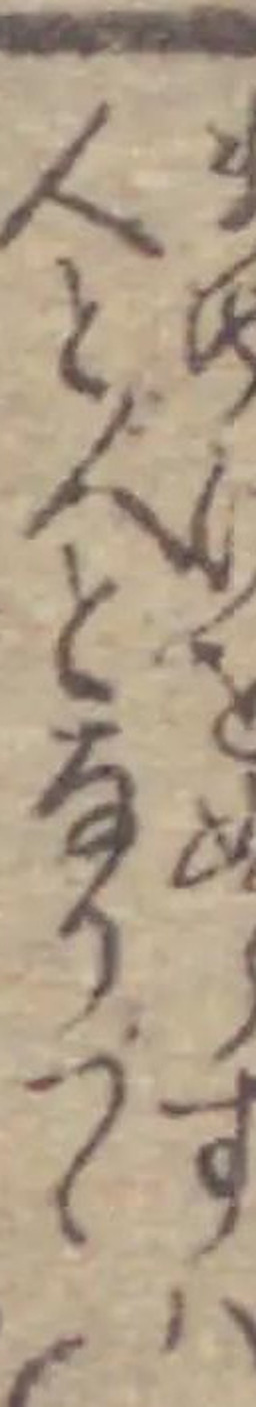人と人となりつゝ
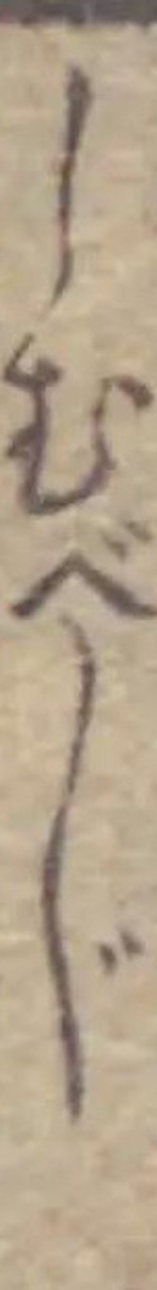しむべし
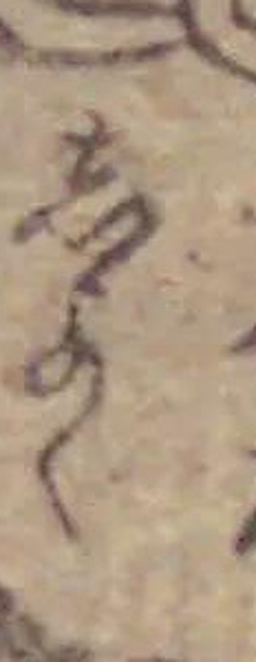しよく
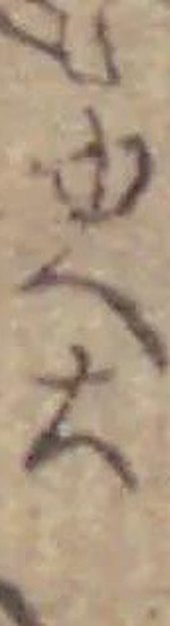ゆへ大

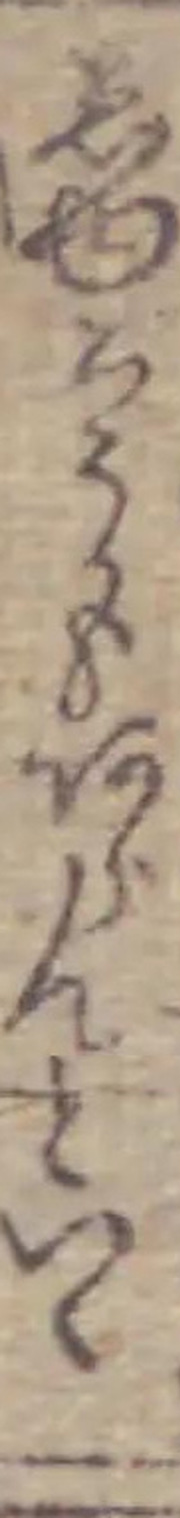しゆこうもあらんといゝ
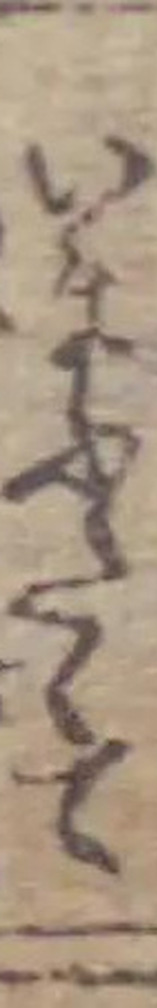いまにたゝて
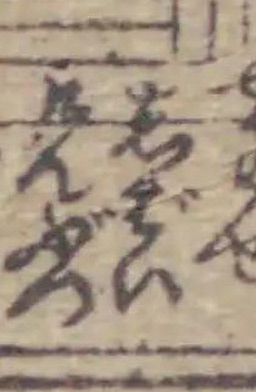しばい
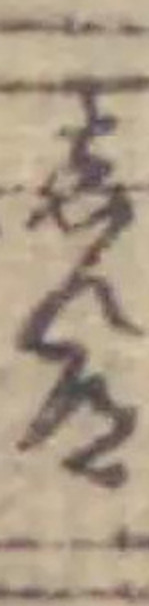しん道

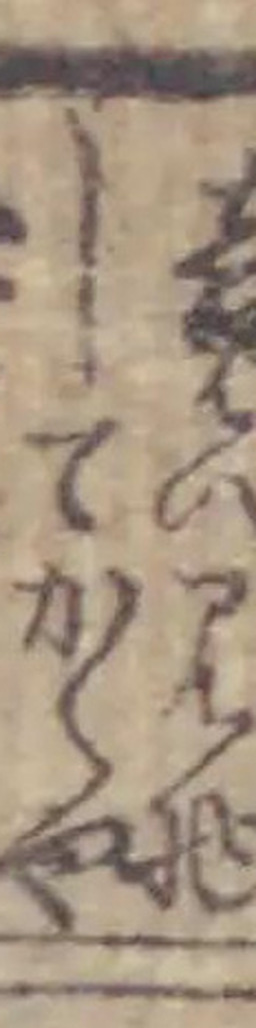してかくや
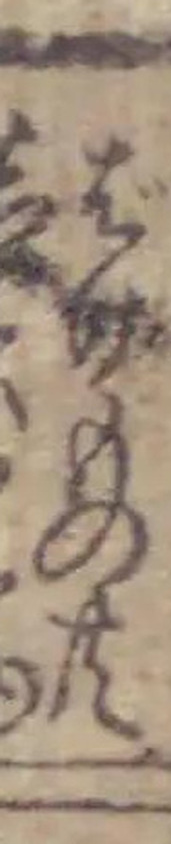ばけもの共
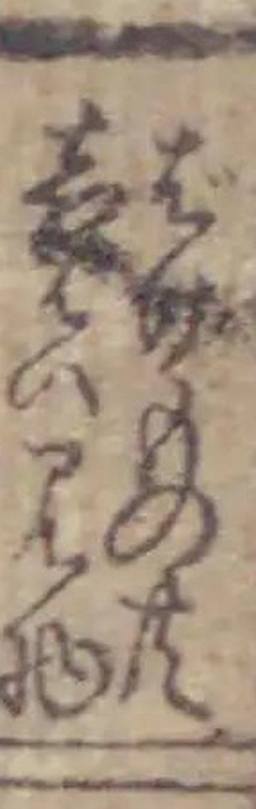しはい見物
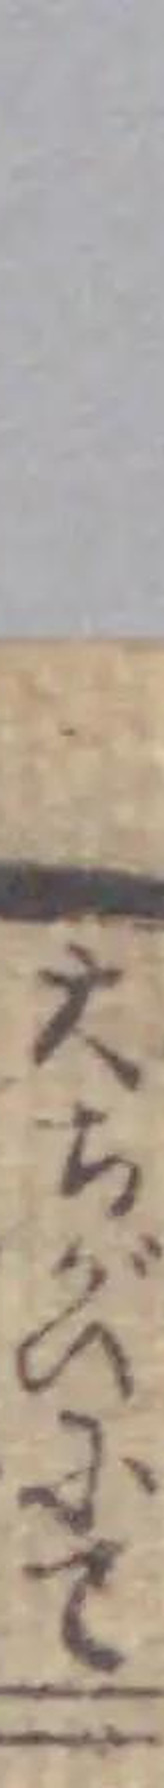大ちがいにて
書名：化物箱根先 2巻
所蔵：国立国会図書館 National Diet Library, JAPAN
